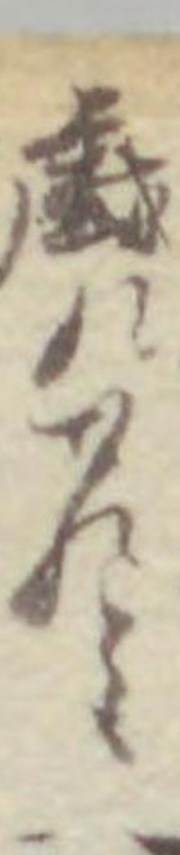戯れなれとも
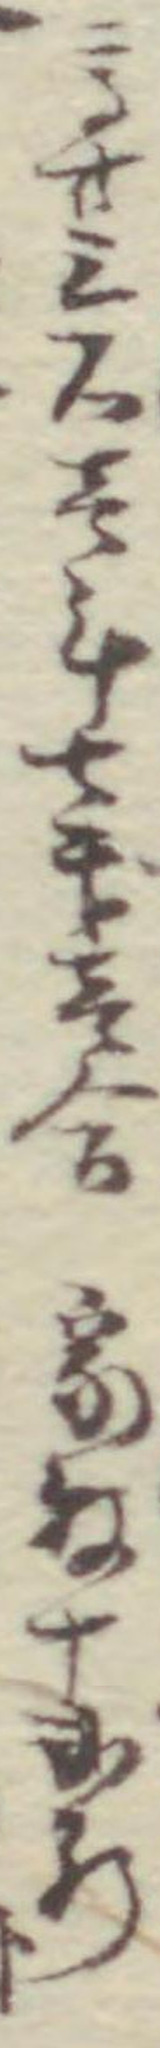高廿三石壱斗七升壱合家数十弐軒
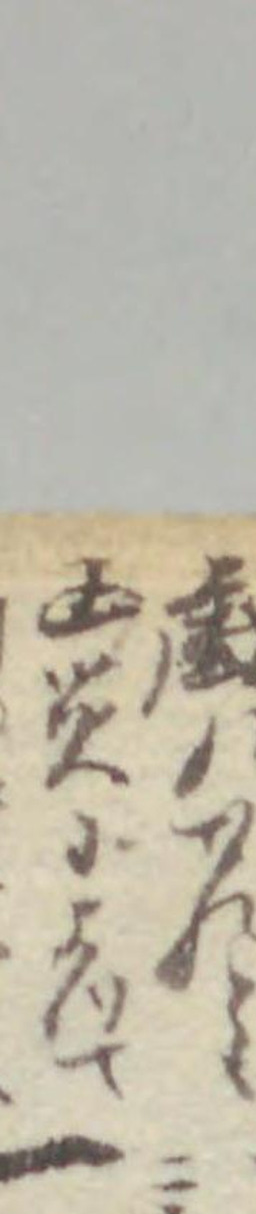凶災によつて
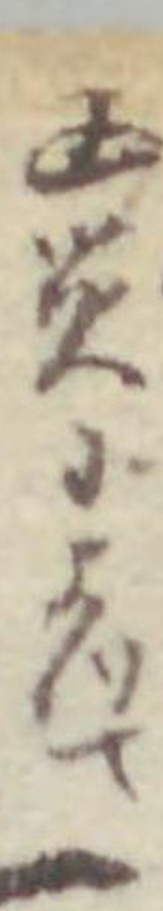凶災によつて
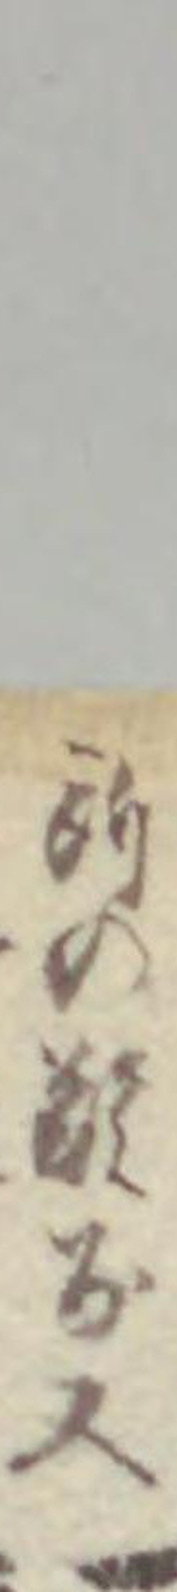所の難別又
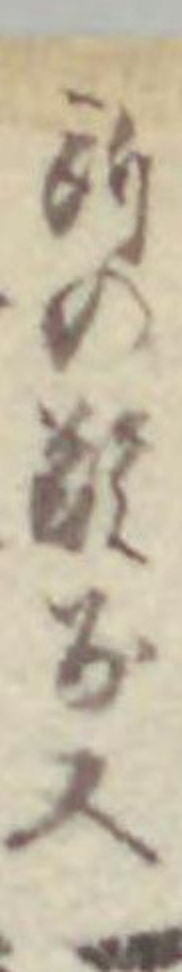所の難別又
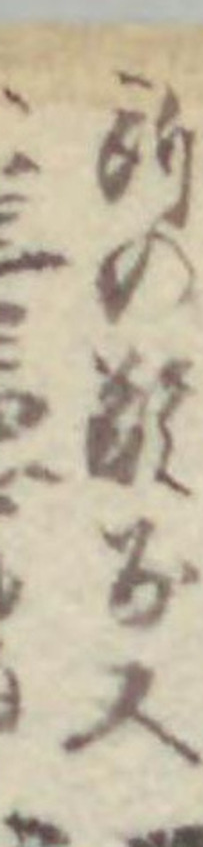所の難別又
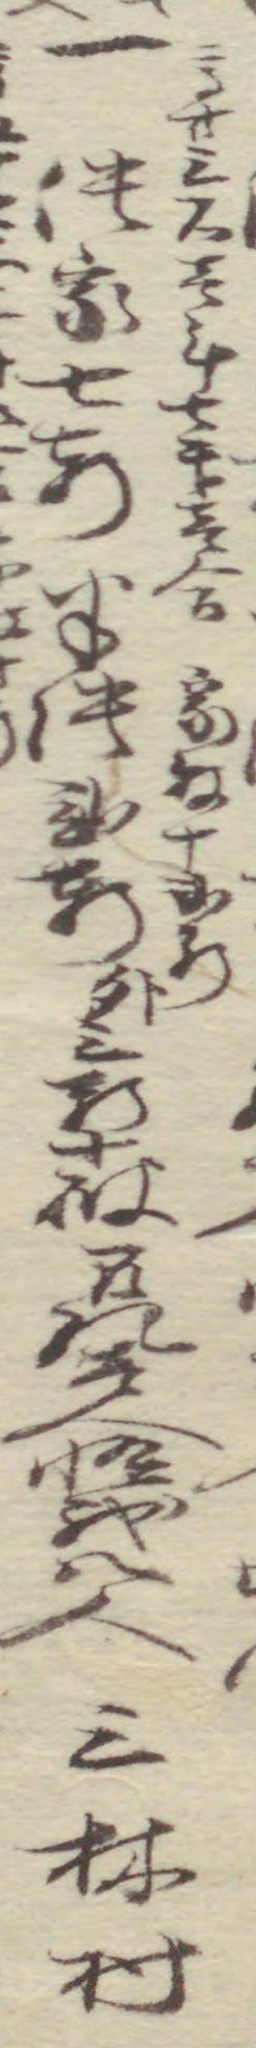一潰家七軒半潰弐軒外三軒小破即死壱人怪我八人三林村
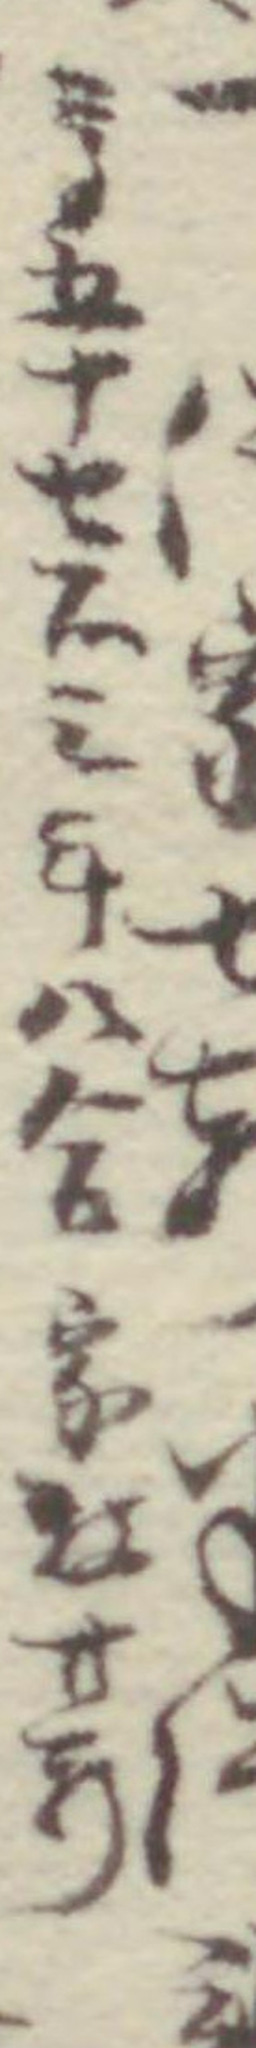高五十七石三斗八合家数廿軒
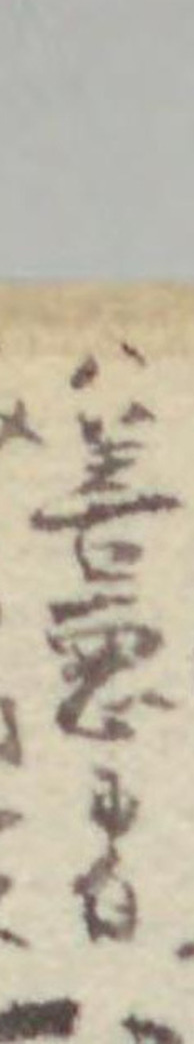ハ善悪に付
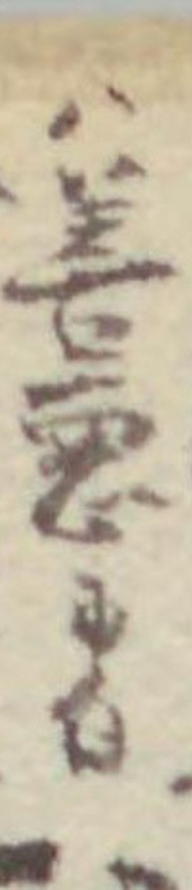ハ善悪に付
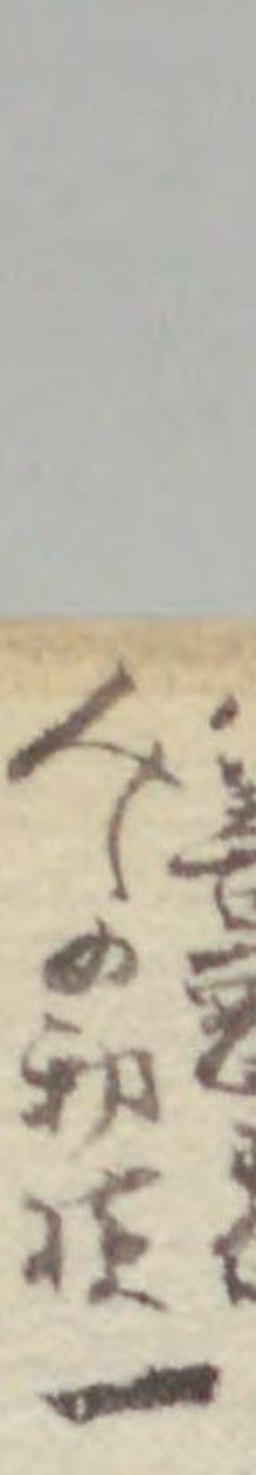人々の邪横
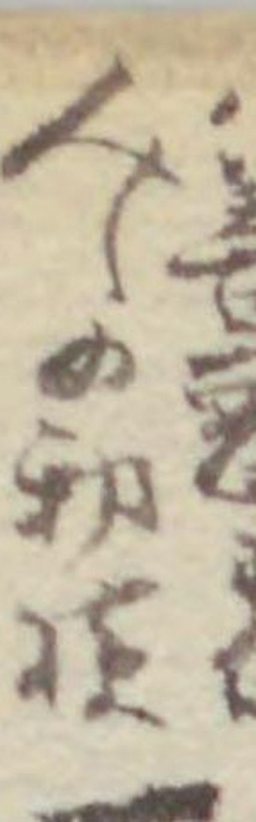人々の邪横
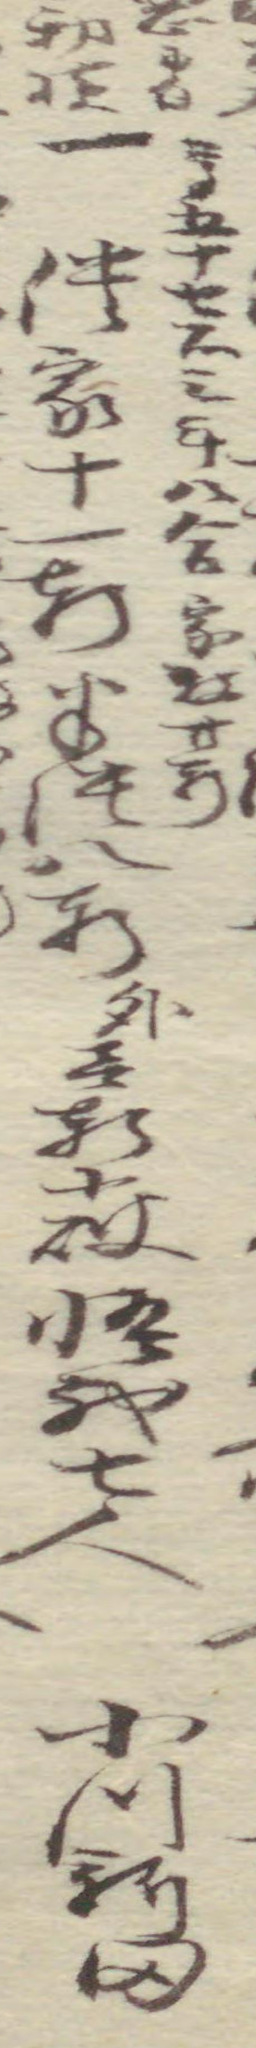一潰家十一軒半潰八軒外壱軒小破怪我七人小川新田
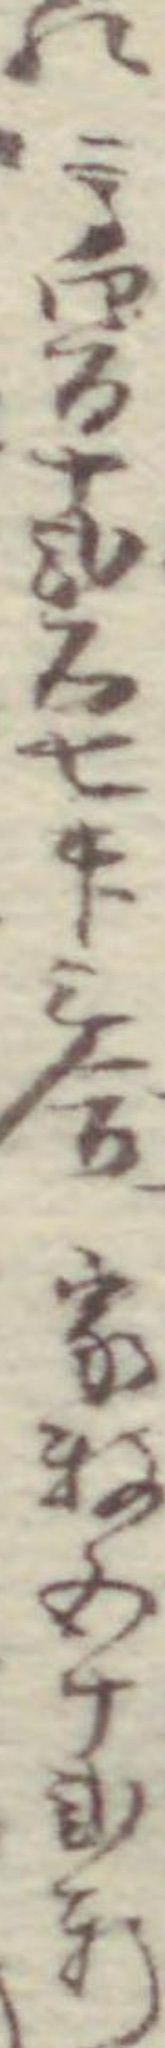高四百十弐石七升三合家数五十弐軒
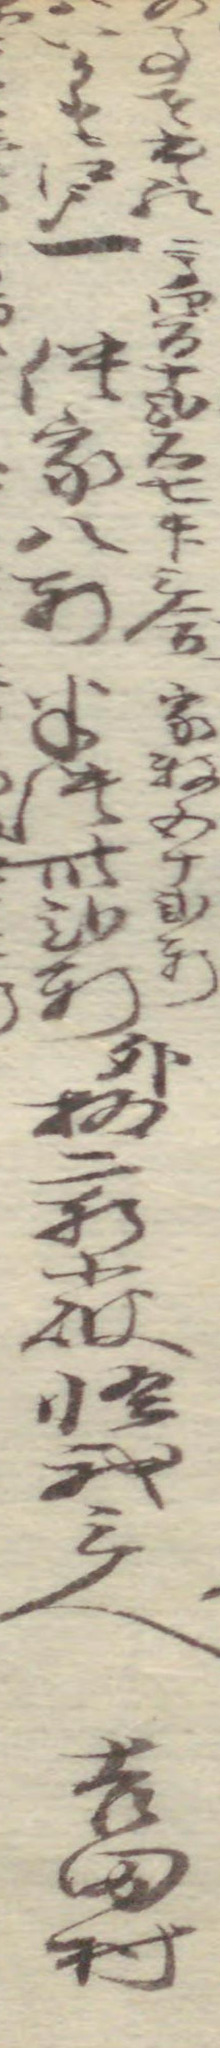一潰家八軒半潰卅弐軒外拾二軒小破怪我三人吉田村
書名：鶯宿雑記. 巻199-200
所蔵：国立国会図書館 National Diet Library, JAPAN
